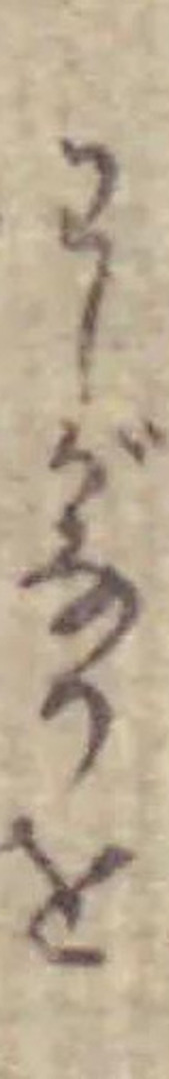わしがなりを
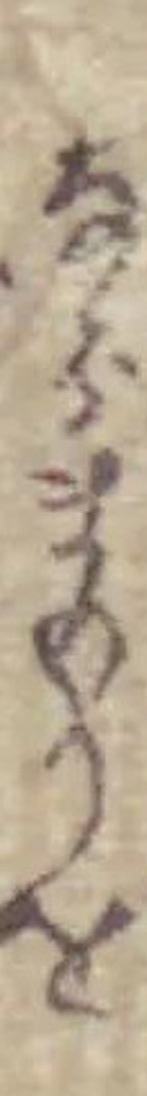ならまもりを
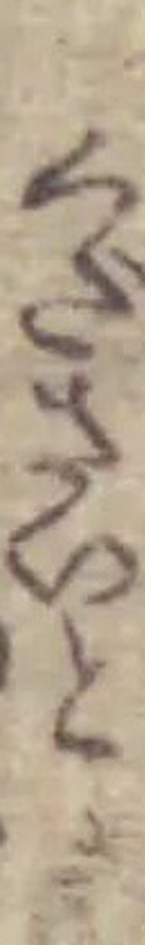くださいと
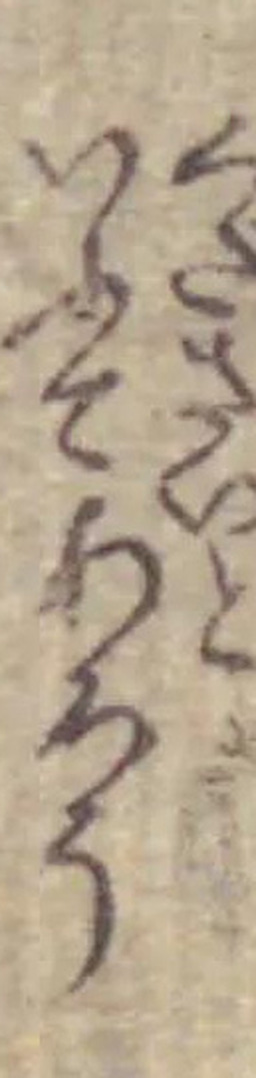いふてあろう
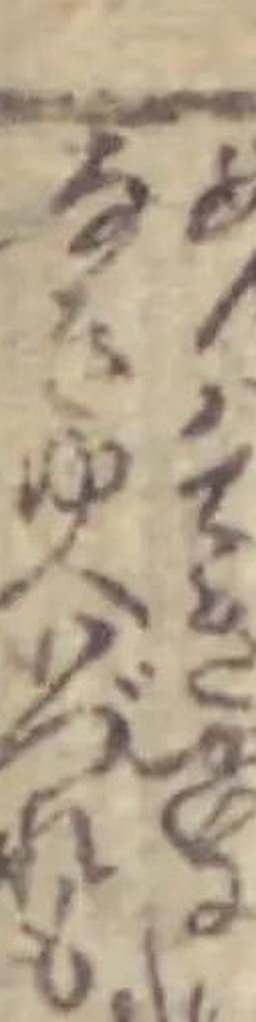なきゆへいづれも
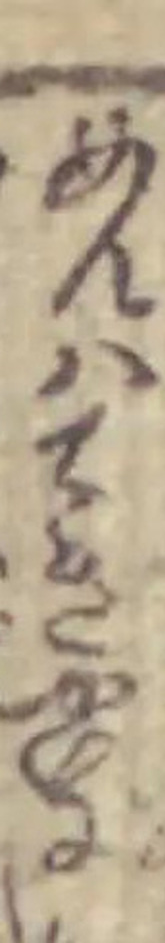めんはてきやいに
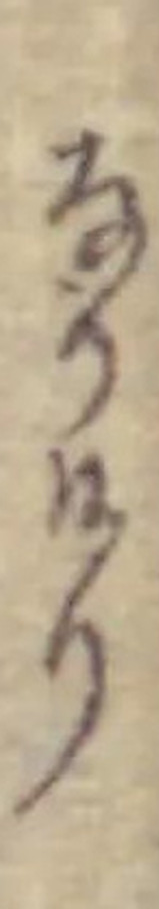なりけり
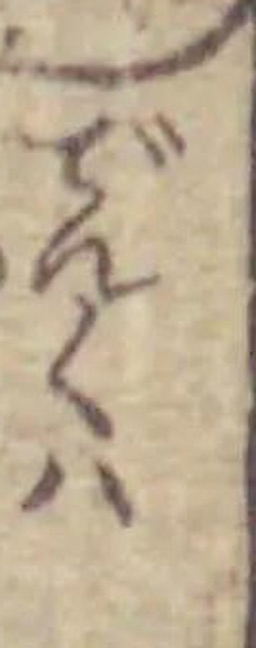でんくは
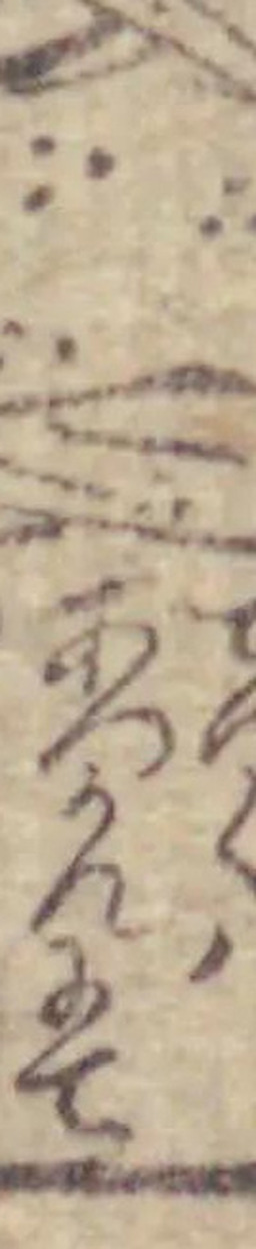あつかんにて
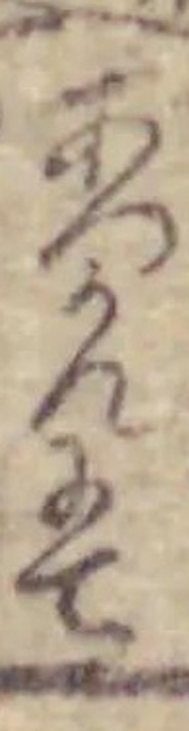あつかんにて
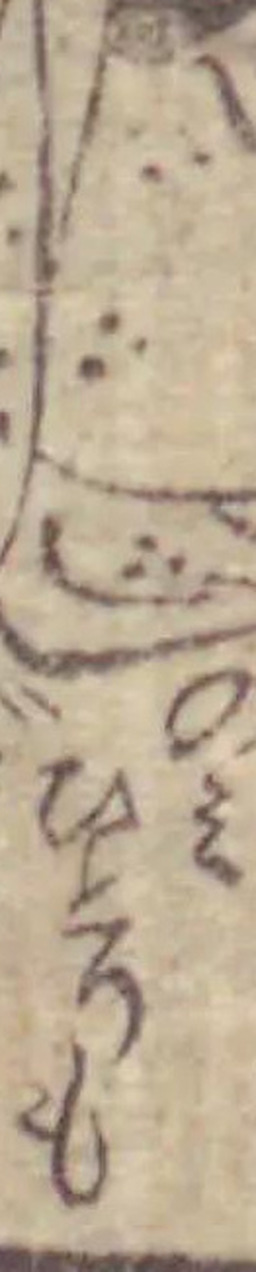ひとりも
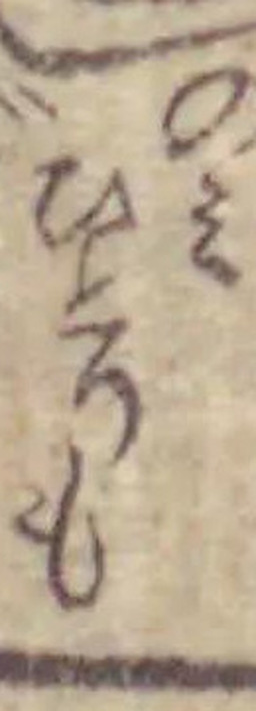ひとりも
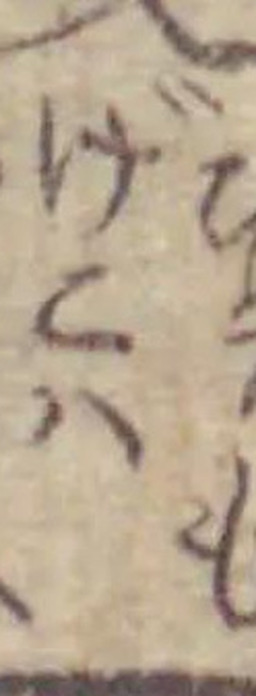げこは
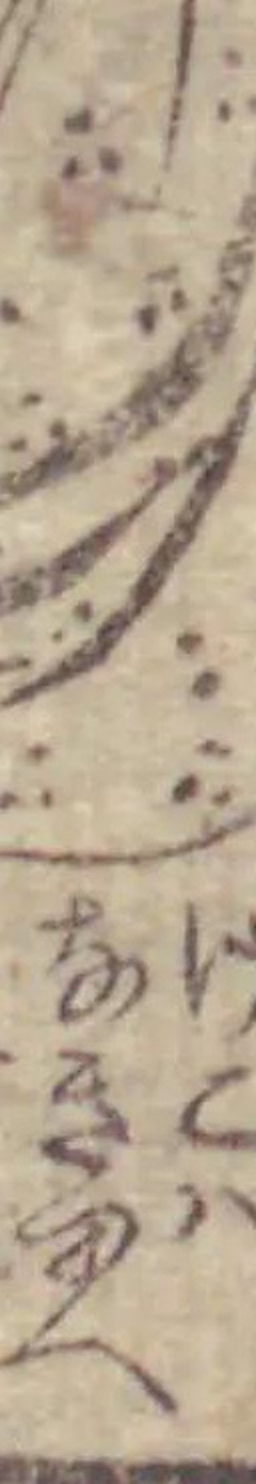なきゆへ
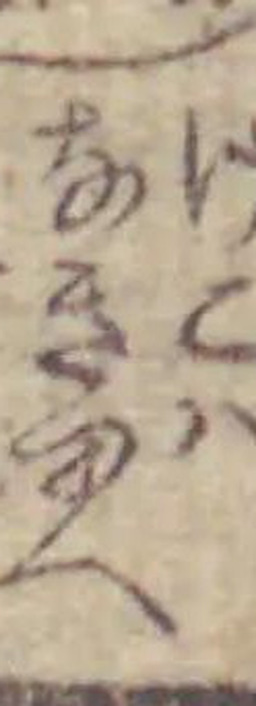なきゆへ
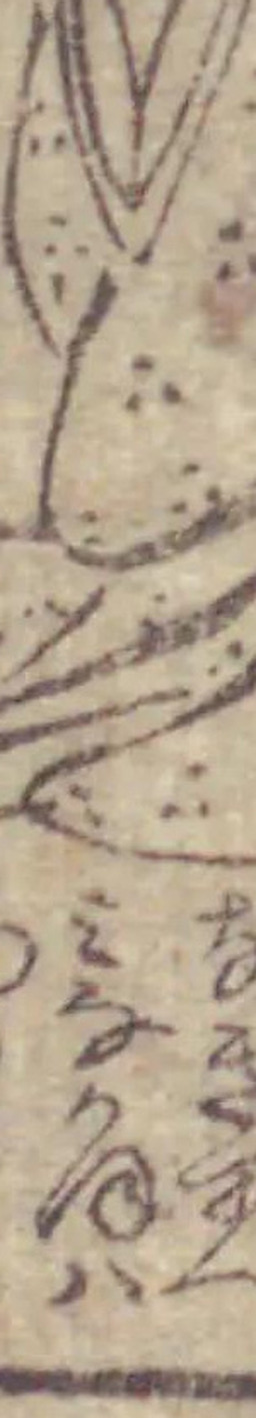みなかほは
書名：珍説女天狗 2巻
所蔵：国立国会図書館 National Diet Library, JAPAN
